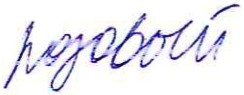розовый
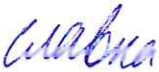славка
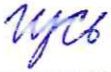гусь
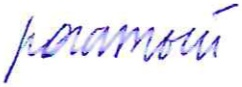рогатый
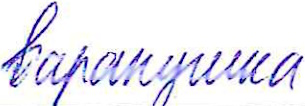варакушка
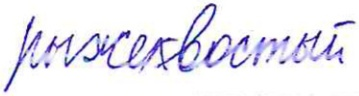рыжехвостый
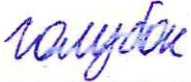голубок
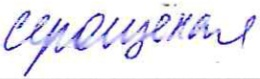серощёкая
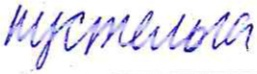пустельга
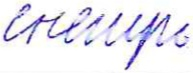снегирь
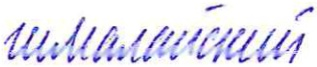гималийский
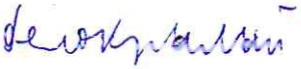белокрылый
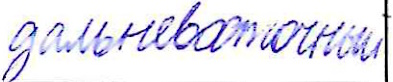дальневосточный
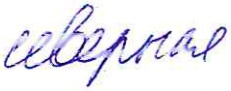северная
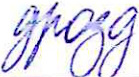дрозд
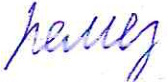ремез
